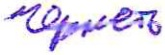чернеть
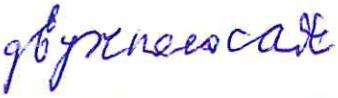двухполосая
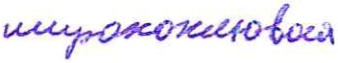ширококлювая
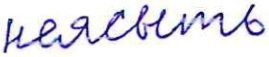неясыть
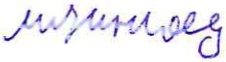личинкоед
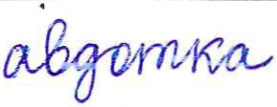авдотка
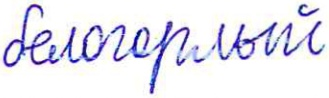белогорлый
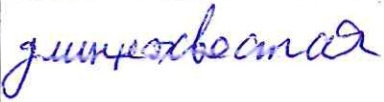длиннохвостая
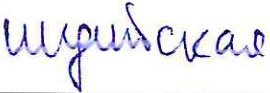индийская
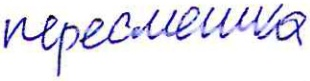пересмешка
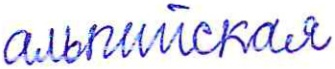альпийская
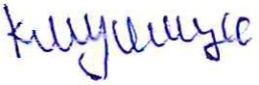клушица
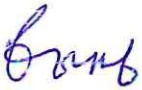выпь
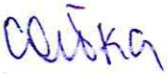сойка
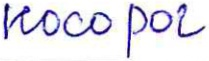носо рог
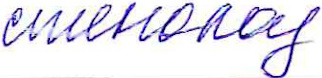стенолаз
